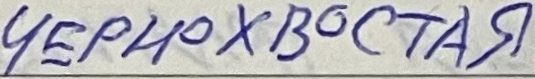чернохвостая
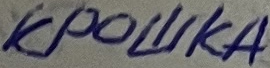крошка
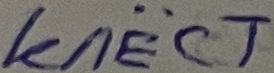клёст
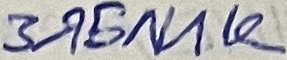зяблик
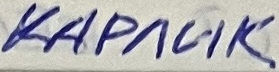карлик
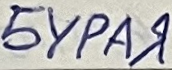бурая
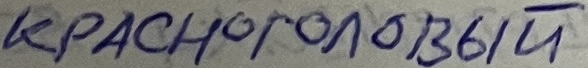красноголовый
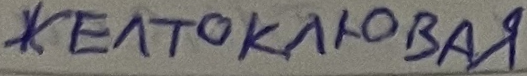желтоклювая
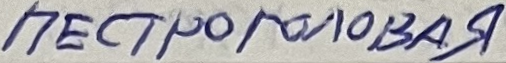пестроголовая
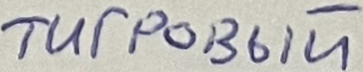тигровый
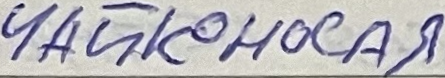чайконосая
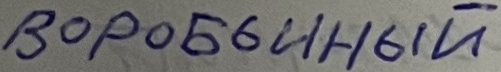воробьиный
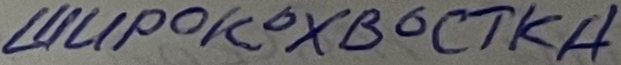широкохвостка
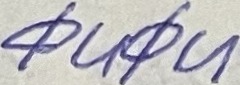фифи
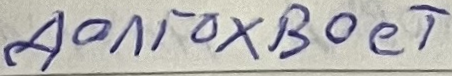долгохвост
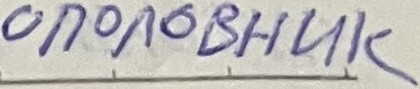ополовник
